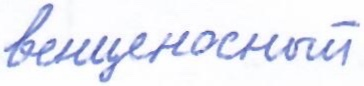венценосный
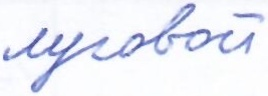луговой
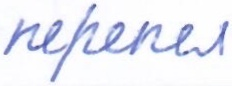перепел
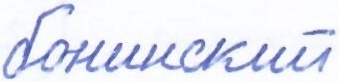бонинский
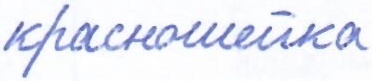красношейка
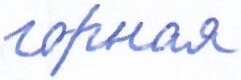горная
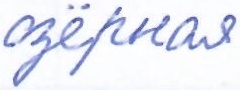озёрная
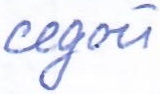седой
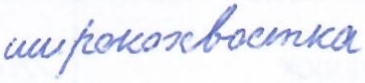широкохвостка
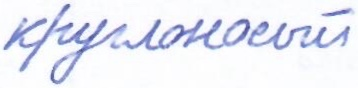круглоносый
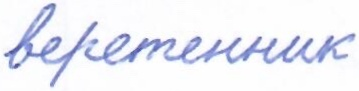веретенник
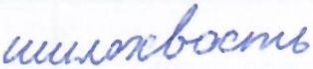шилохвость
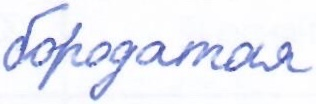бородатая
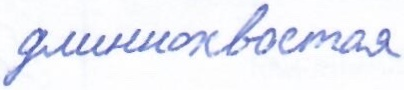длиннохвостая
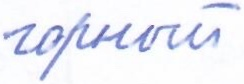горный
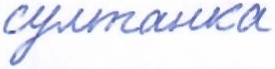султанка
